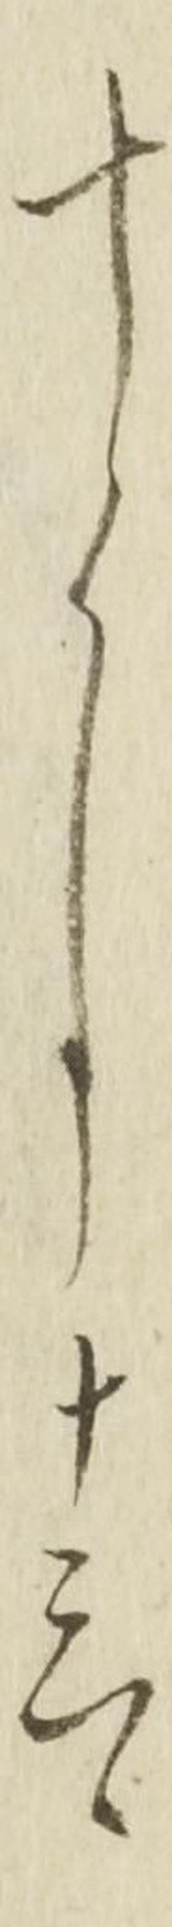十月十三日
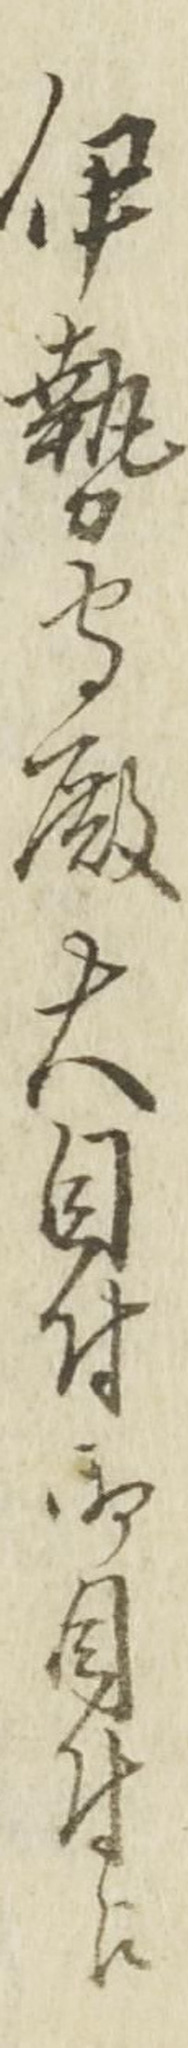伊勢守殿大目付御目付え
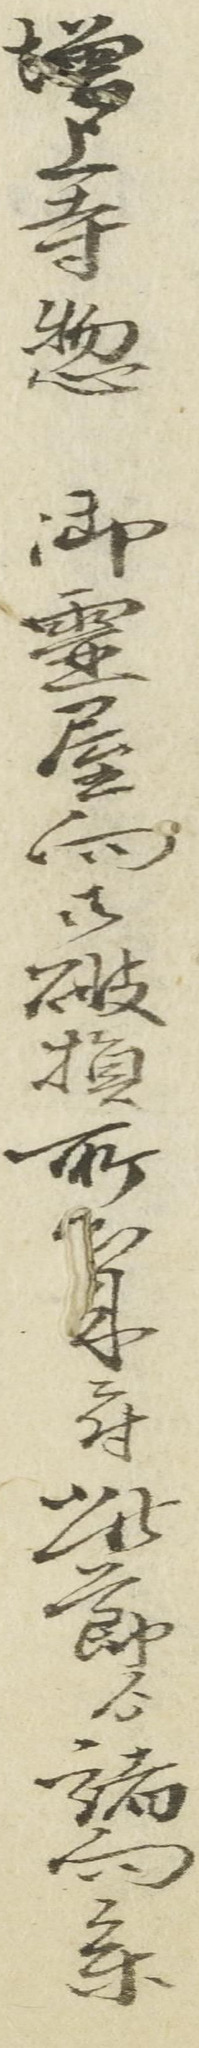増上寺惣御霊屋向御破損所出来二付此節ゟ諸向参
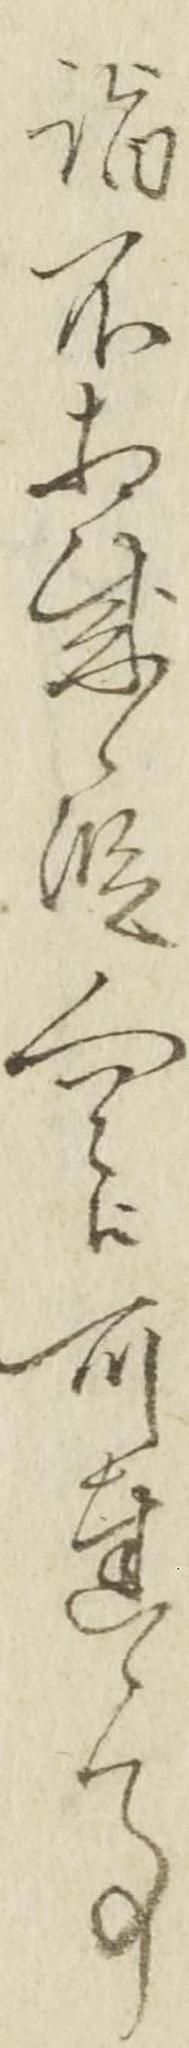詣不相成候段向々え可達候事
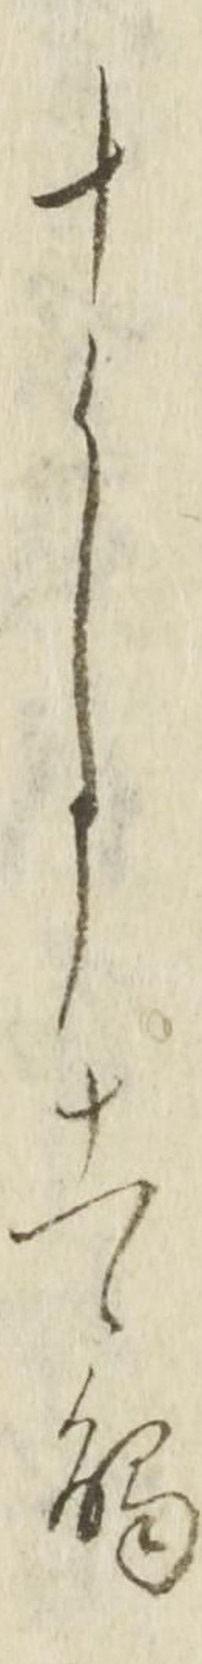十月十一日触
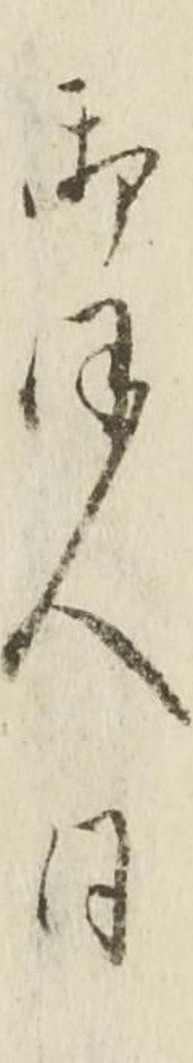御同人同
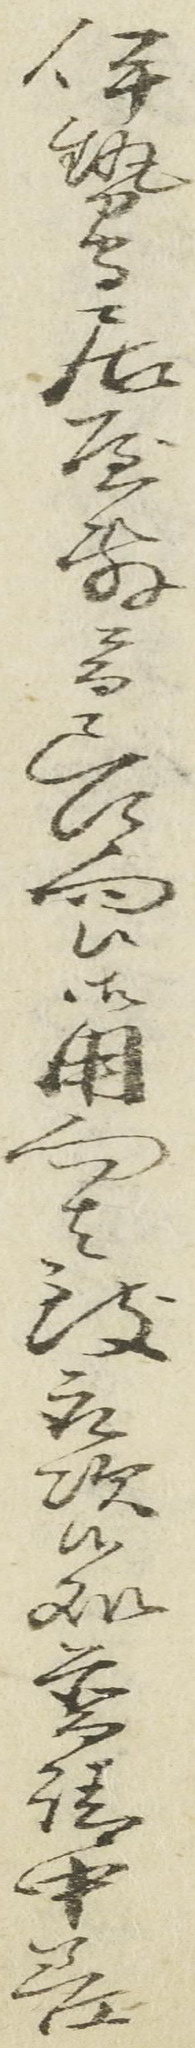伊勢守居屋敷二而差向ひ御用向は致取次候処普請中差
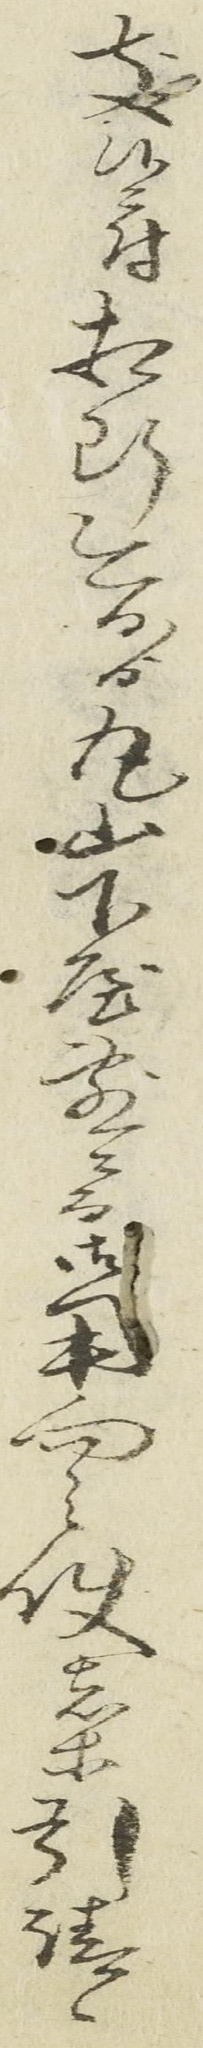支候二付相断今日ゟ丸山下屋敷二而御用向之使者等引請候
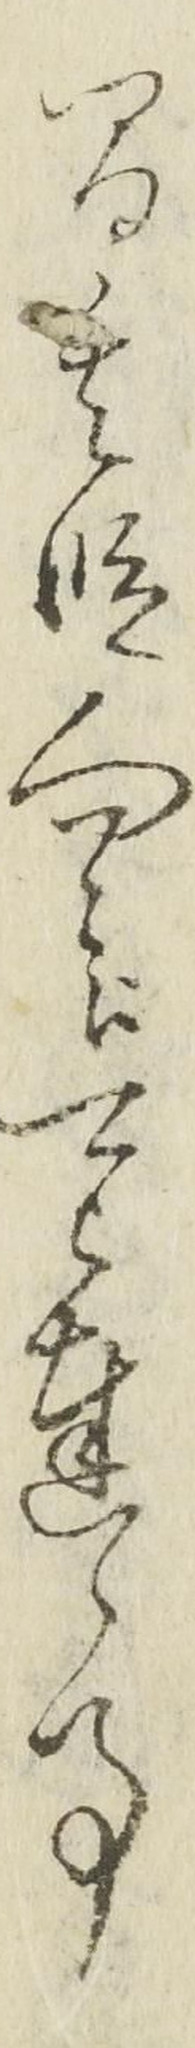間其段向々え可被達候事
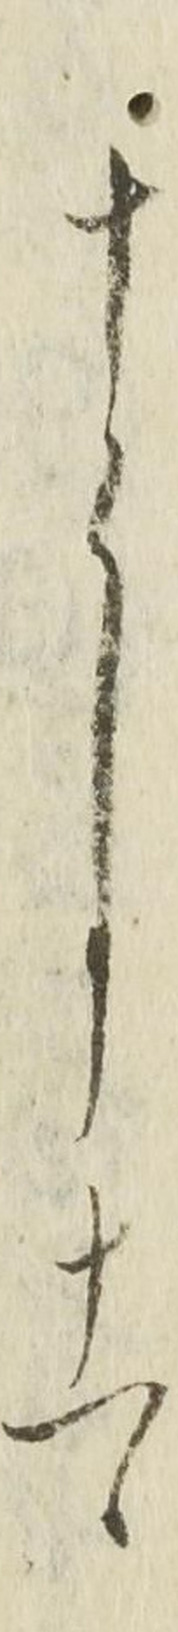十月十一日
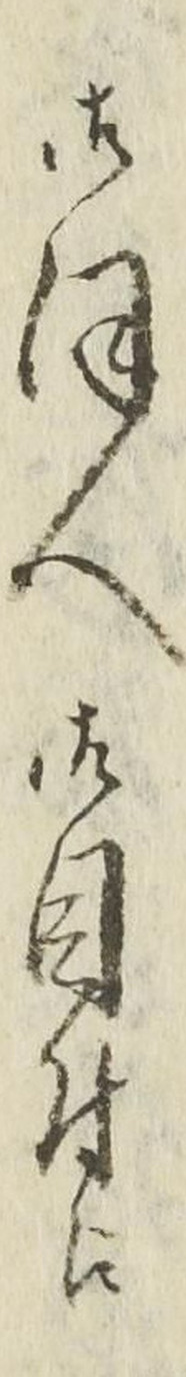御同人御目付え
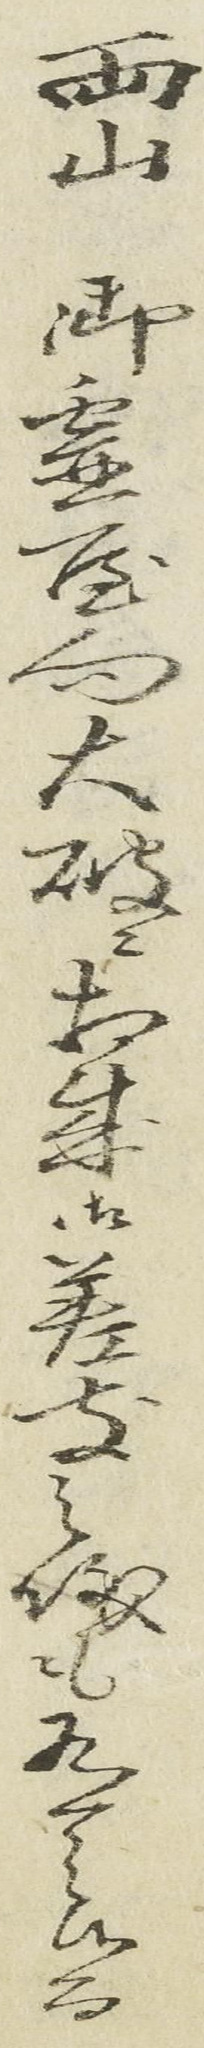両山御霊屋向大破二相成御差支之儀も有之候而
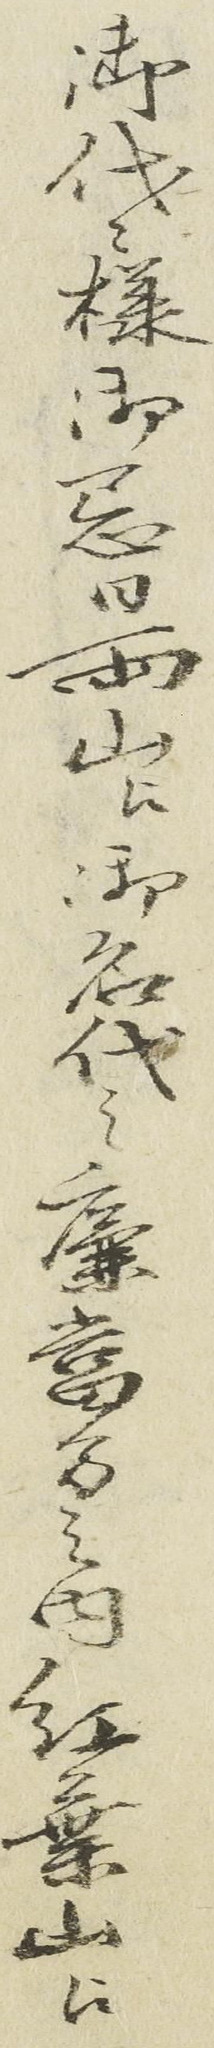御代々様御忌日両山え御名代之廉当方之内紅葉山え
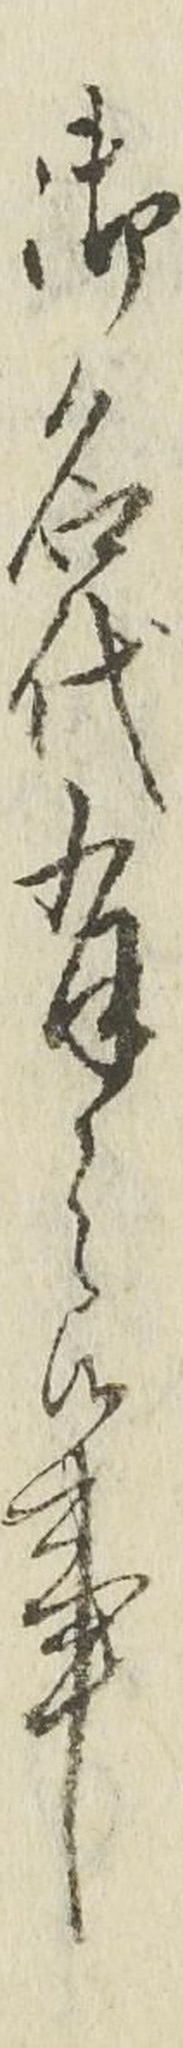御名代有之候事
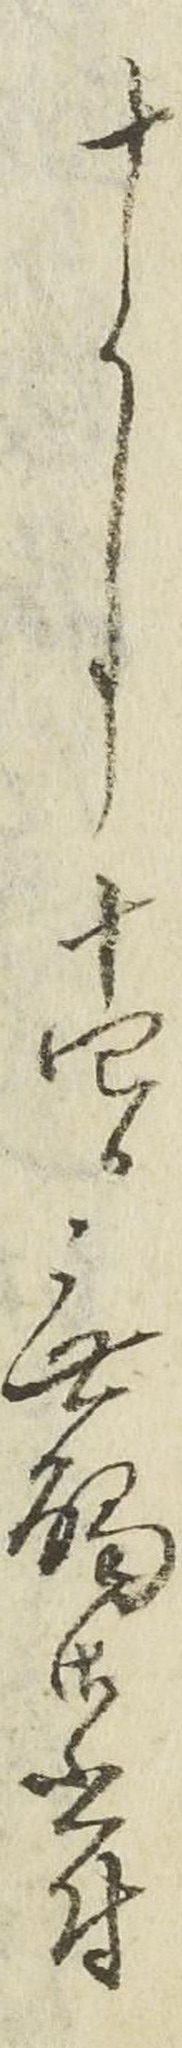十月十四日無触御書付
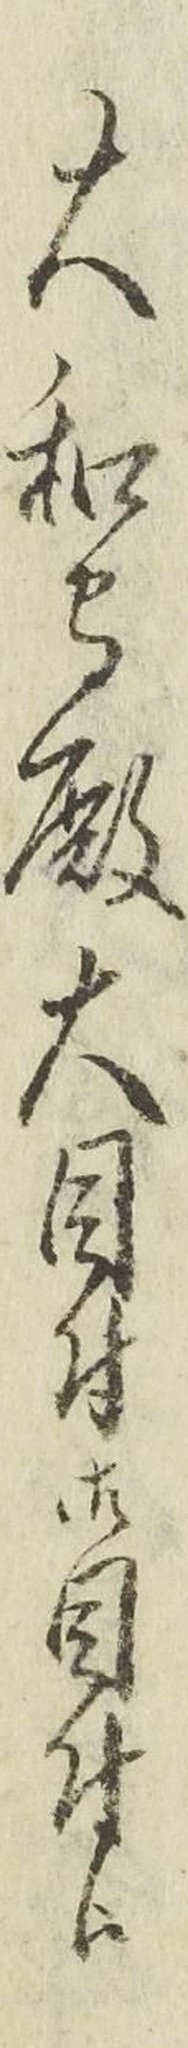大和守殿大目付御目付
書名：安政二乙卯年十月二日大地震之事
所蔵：東京大学地震研究所図書室 Earthquake Research Institute Library, The University of Tokyo, JAPAN
